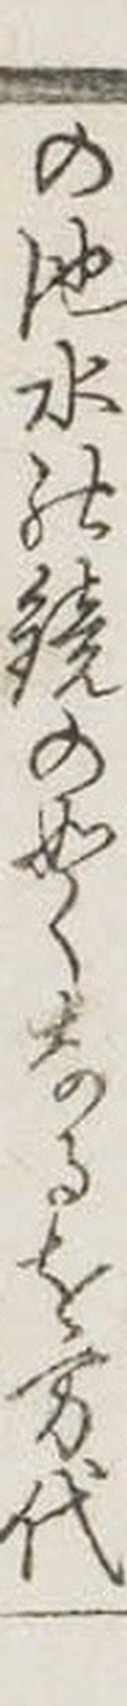の池水の鏡の如くなるを万代
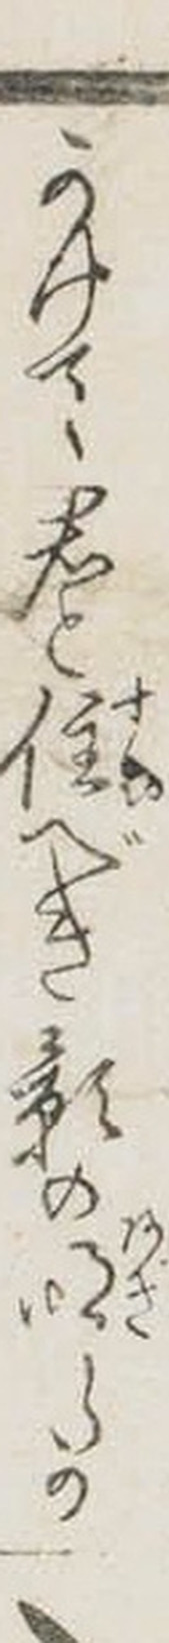かけて君と住べき影の明らか
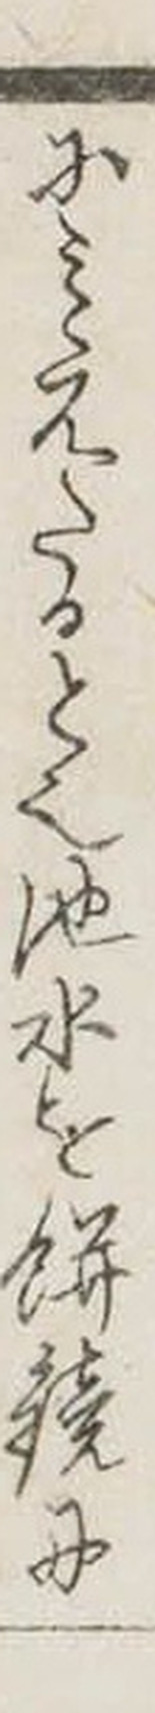にみえたると也池水を餅鏡に
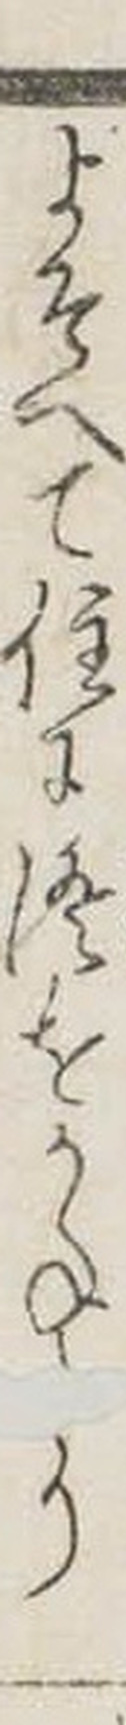よそへて住に澄をかねたり

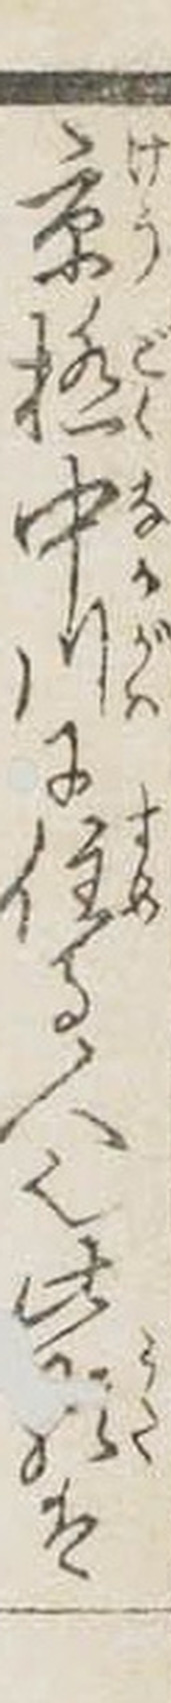京極中川に住る人也此歌は
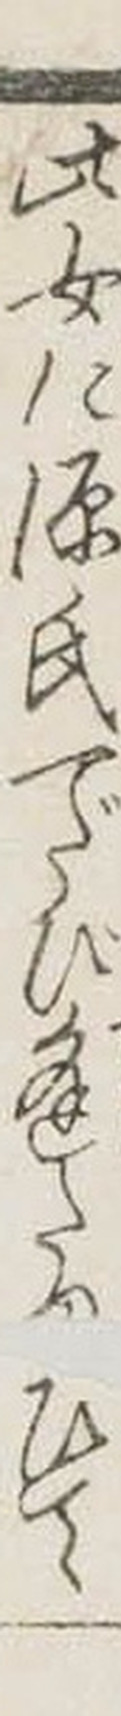此女に源氏一だび逢たまひて
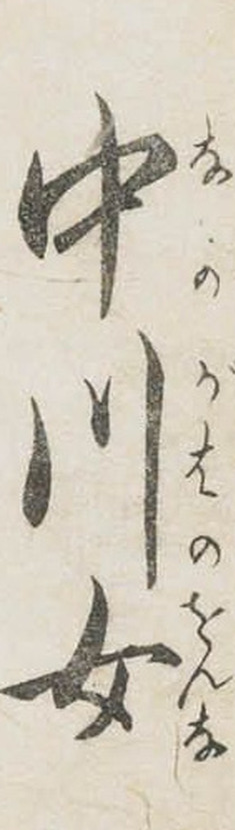中川女
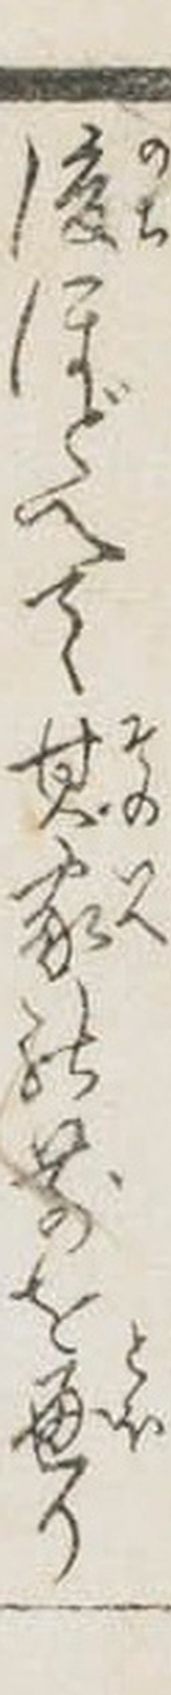後ほどへて其家の前を通り
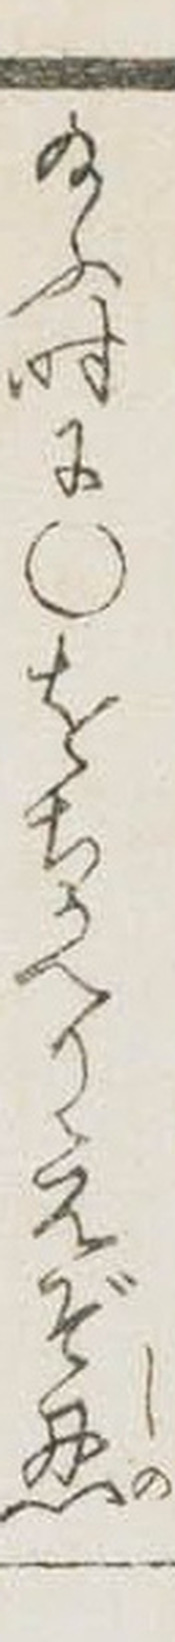給ふ時に○をちかへりえぞ忍
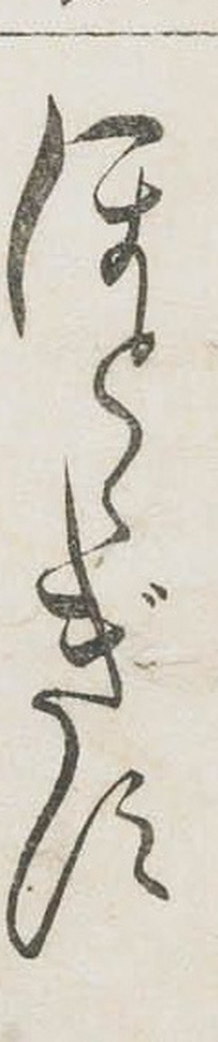ほとゝぎす
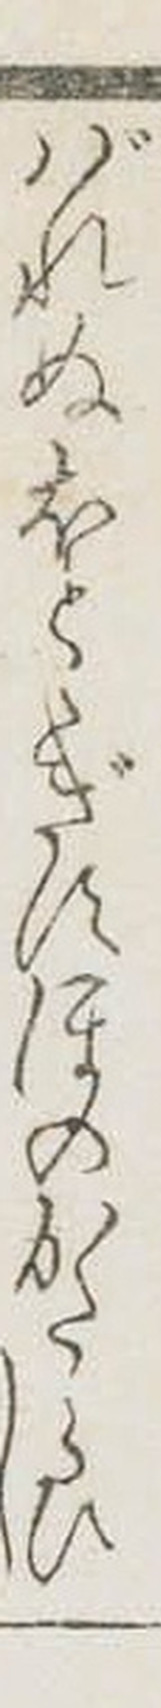ばれぬほとゝぎすほのかたらひし
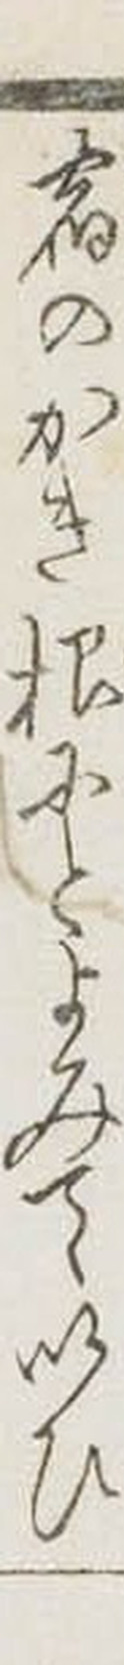宿のかき根にとよみていひ
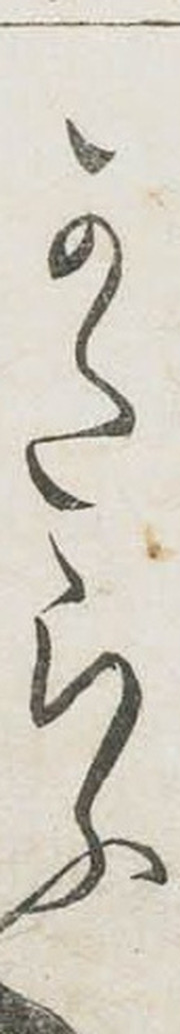かたらふ
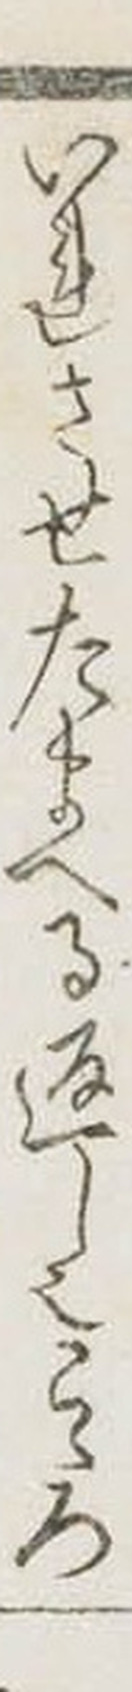いれさせたまへる返し也こゝろ
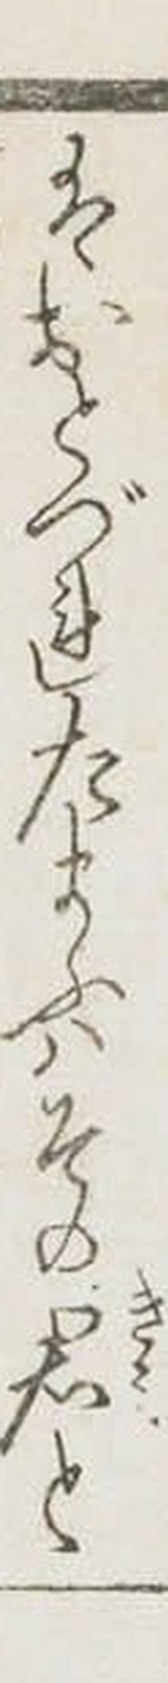はおとづれたまふはその君と
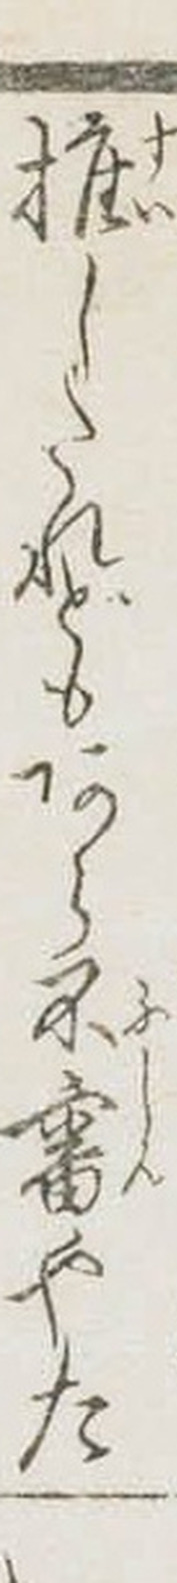推したれどもあら不審やた
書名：源氏百人一首
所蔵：東京学芸大学教育コンテンツアーカイブ
